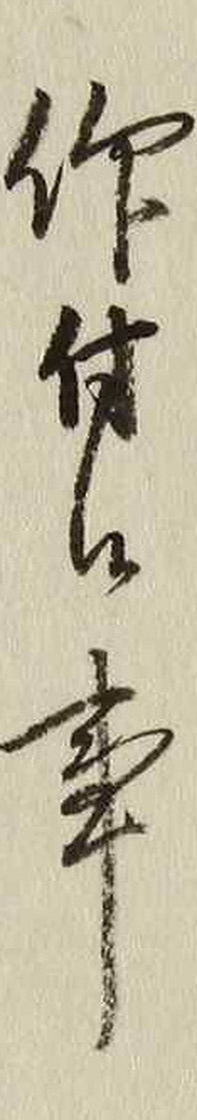仰付候事
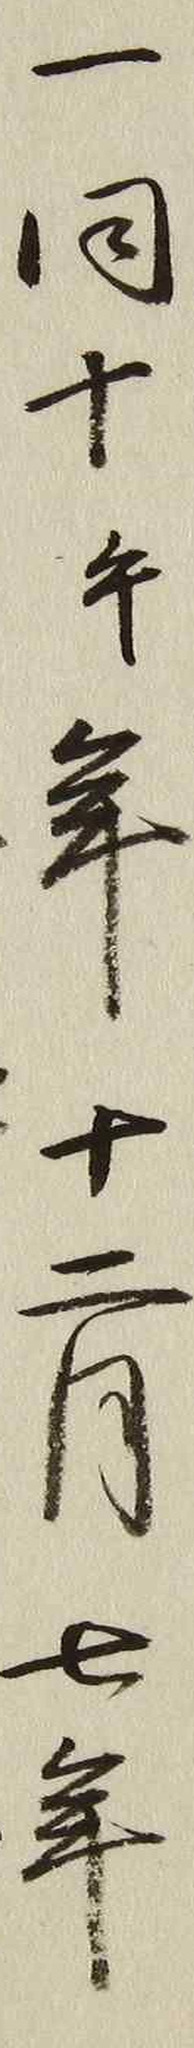一同十午年十二月七年
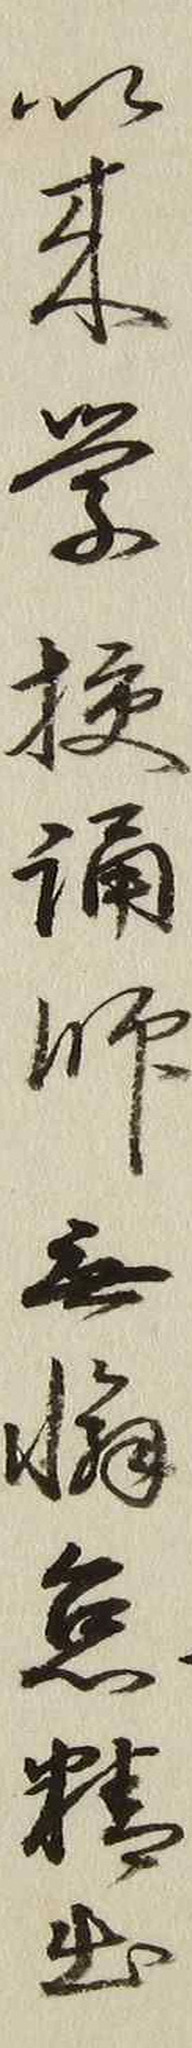以来学校誦師無懈怠精出
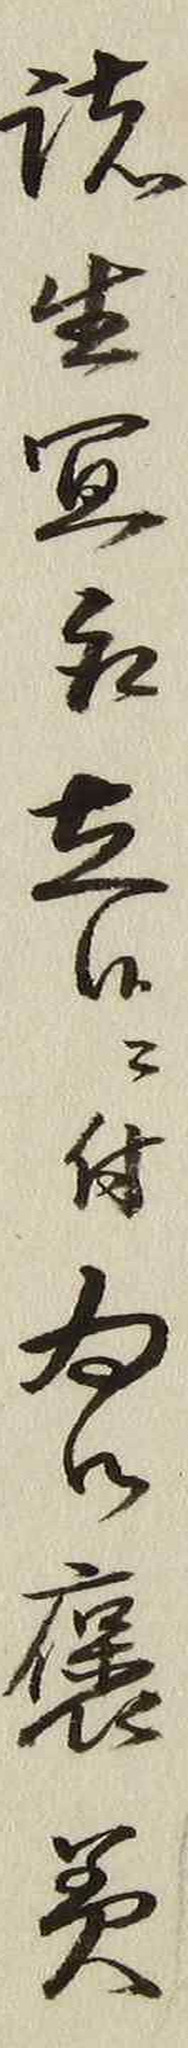諸生宜取立候ニ付為御褒美
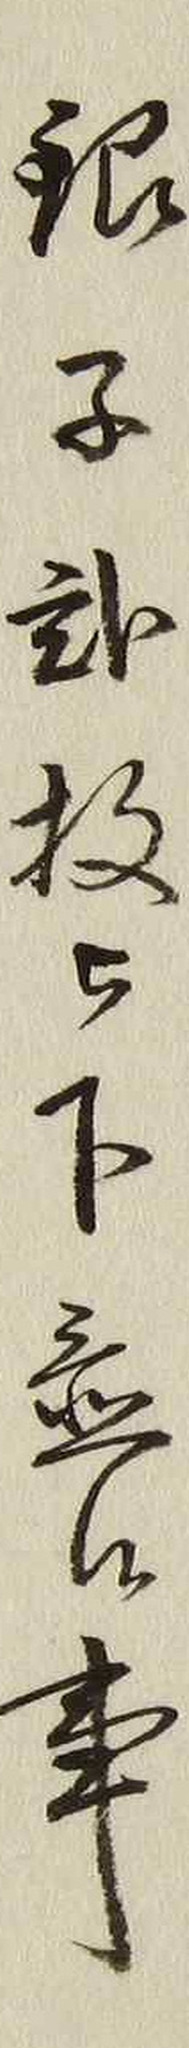銀子弐枚被下置候事
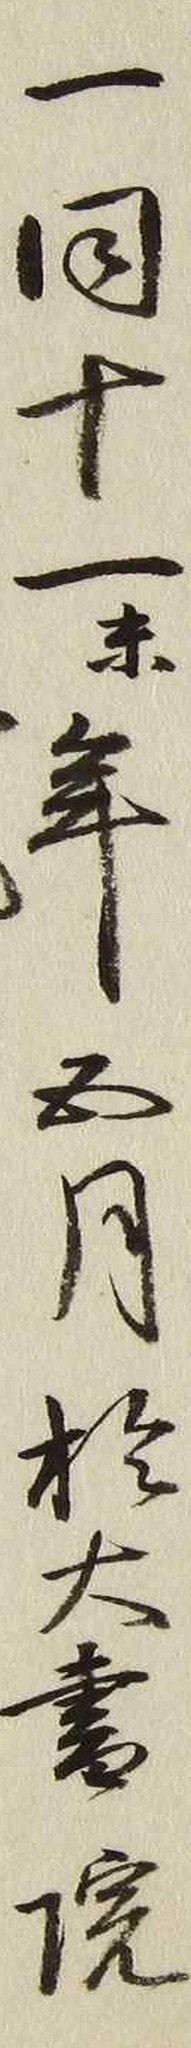一同十一未年五月於大書院
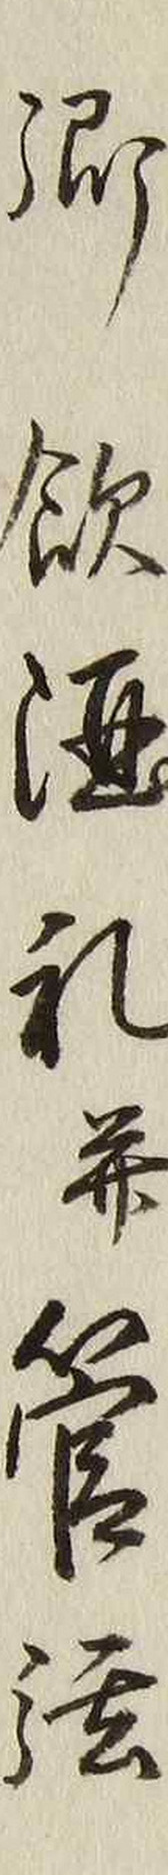郷飲酒礼并管絃
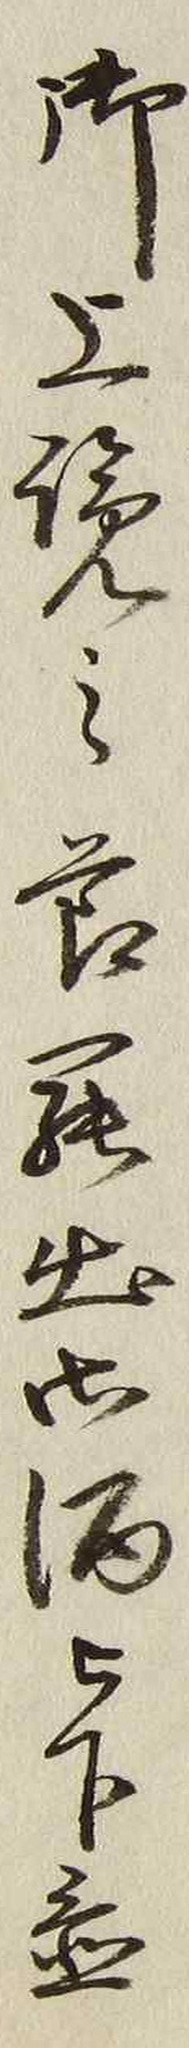御上覧之節罷出御酒被下置
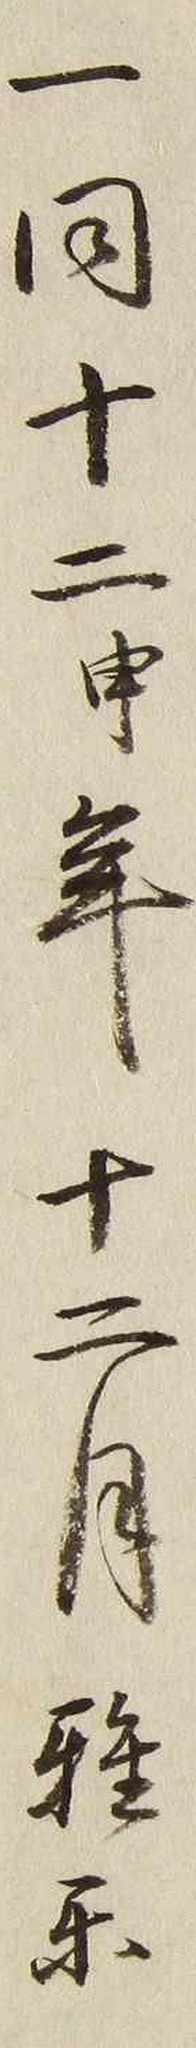一同十二申年十二月雅楽

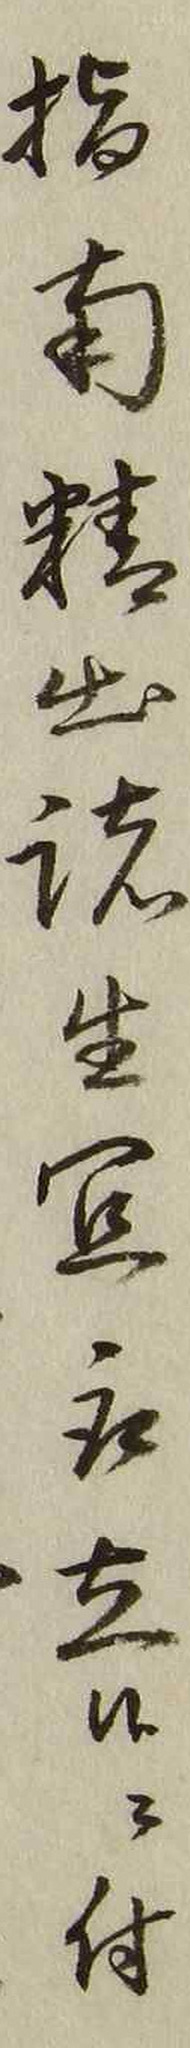指南精出諸生宜取立候ニ付
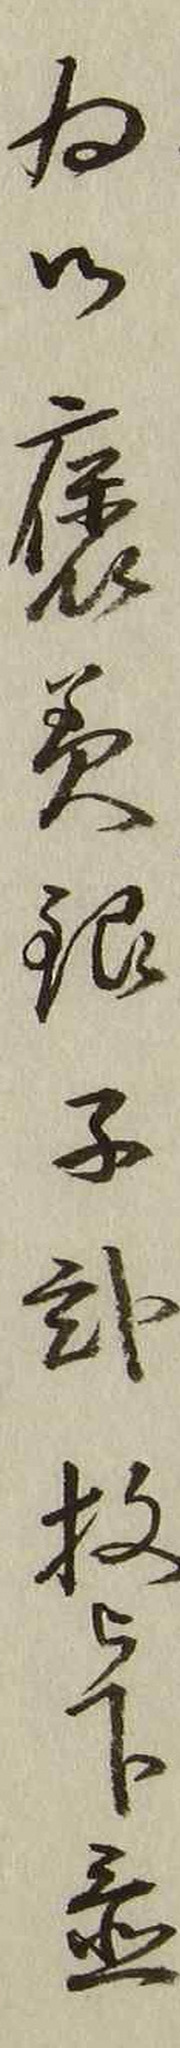為御褒美銀子弐枚被下置
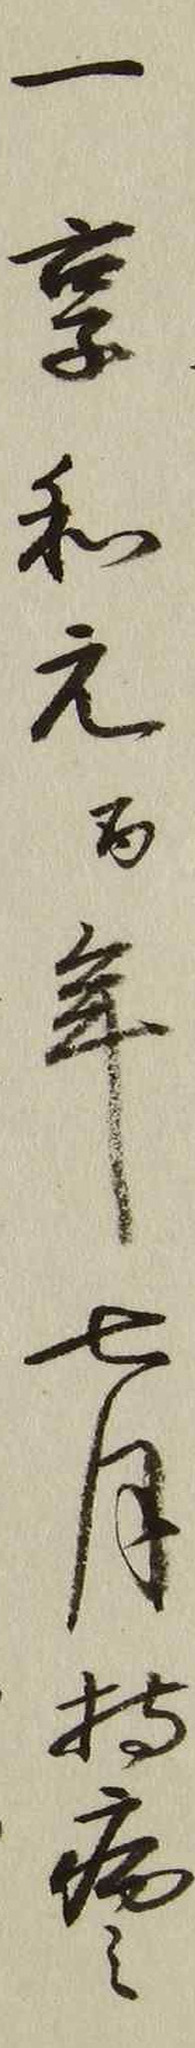一享和元酉年七月持病之
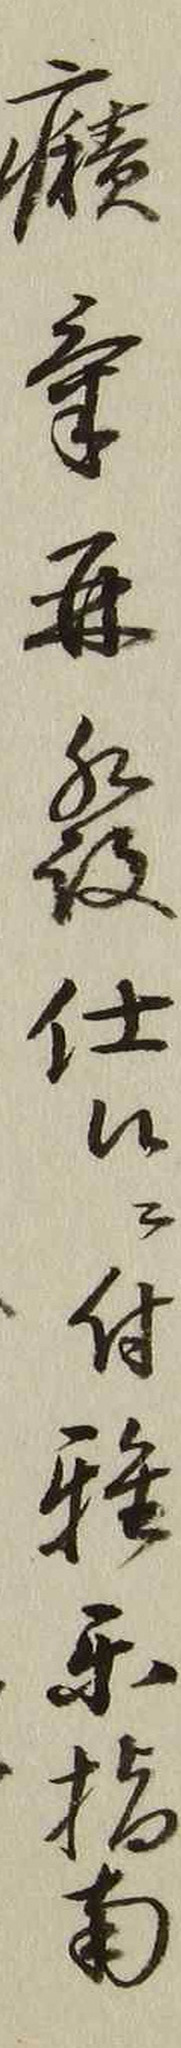癪気再発仕候ニ付雅楽指南
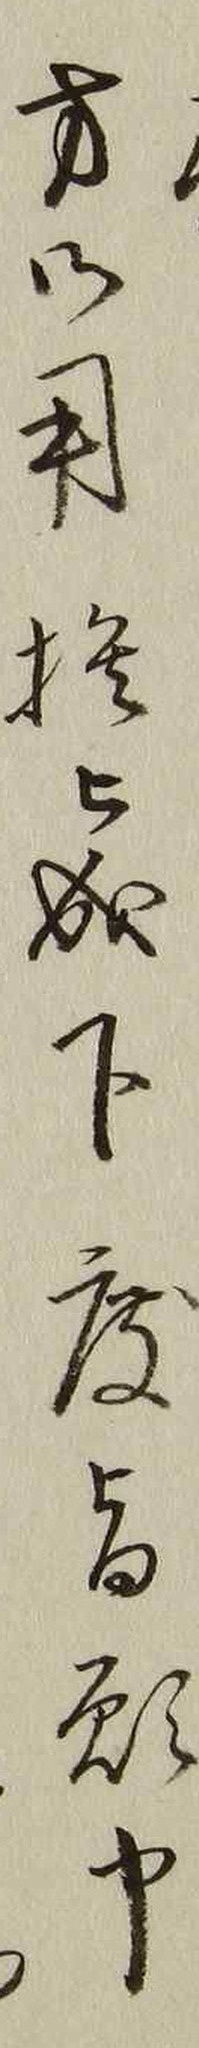方御用捨被成下度旨願申
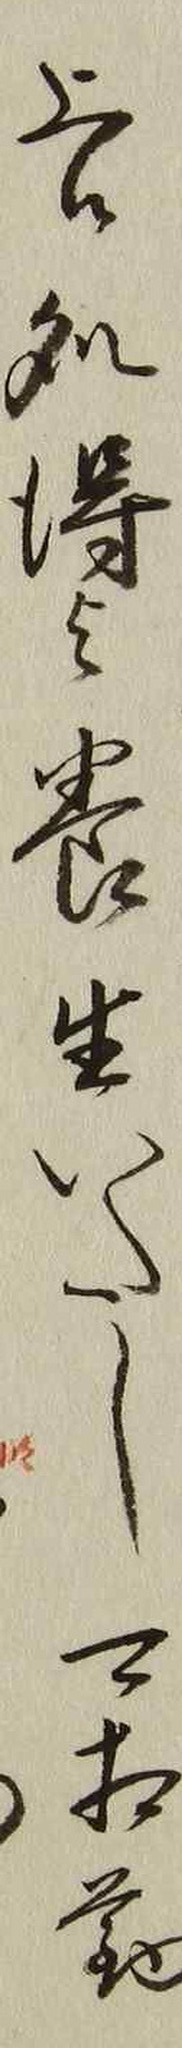上候処得与養生いたし可相勤
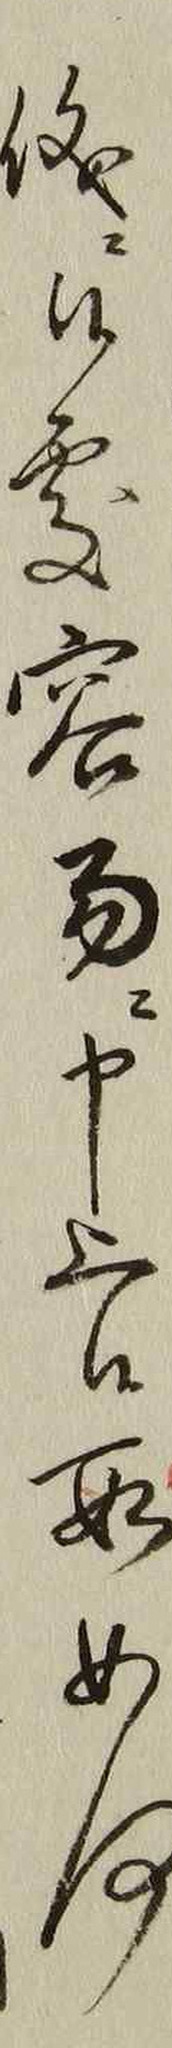儀ニ候処容易ニ申上候段如何
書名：諸士系譜　巻之136　た之部12
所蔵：会津若松市立会津図書館
